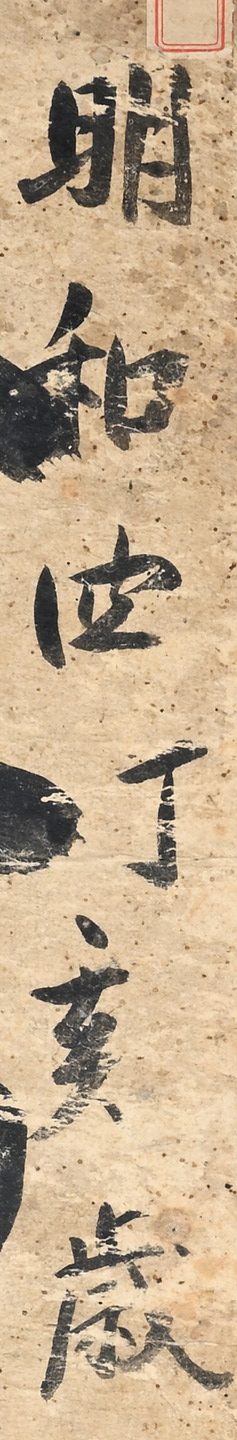明和四丁亥歳
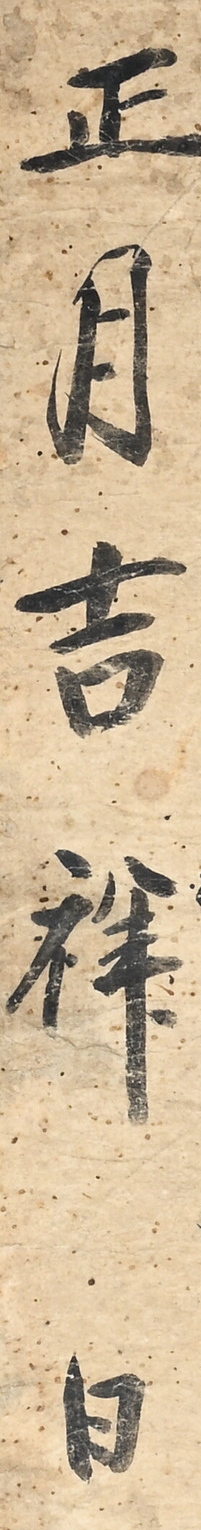正月吉祥日

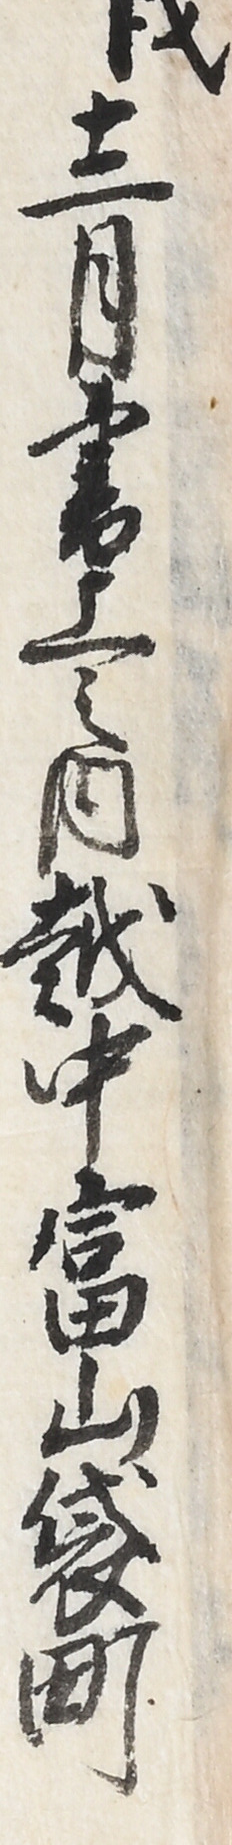戌十二月書上之内越中富山袋町
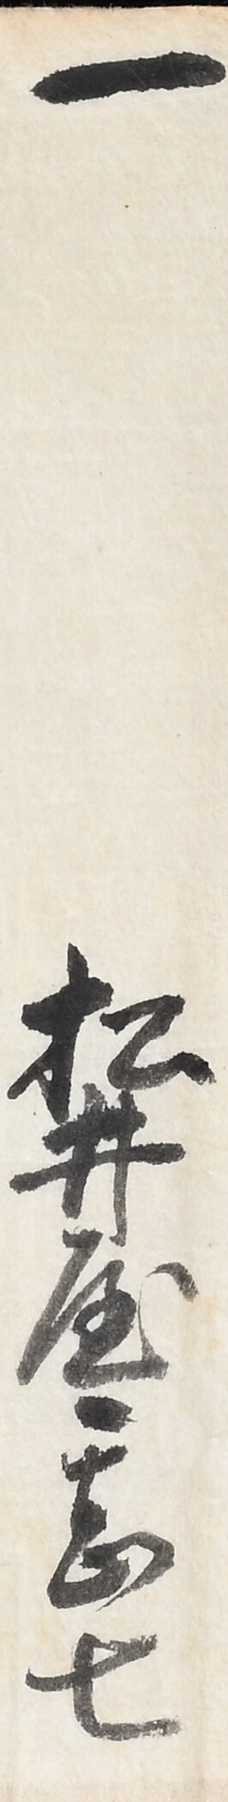一松井屋甚七
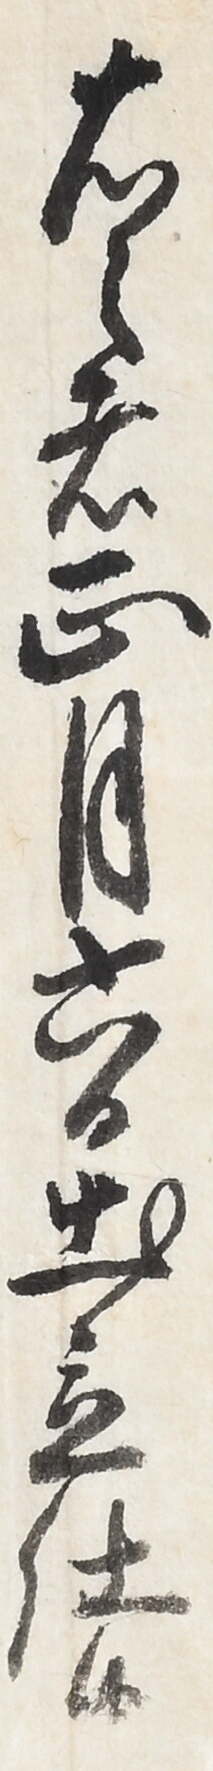右之者正月六日出立仕候
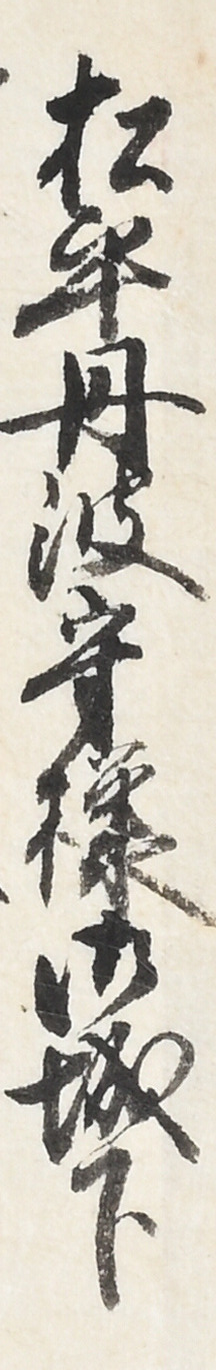松平丹波守様御城下
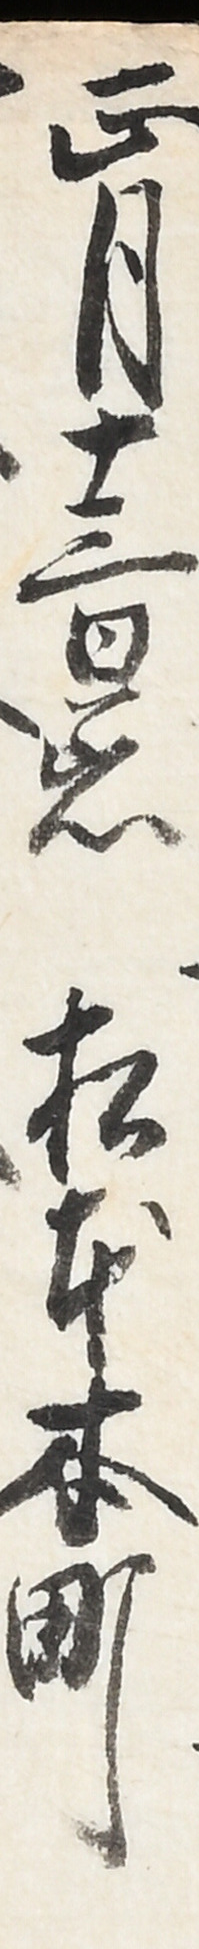正月十三日着松本本町
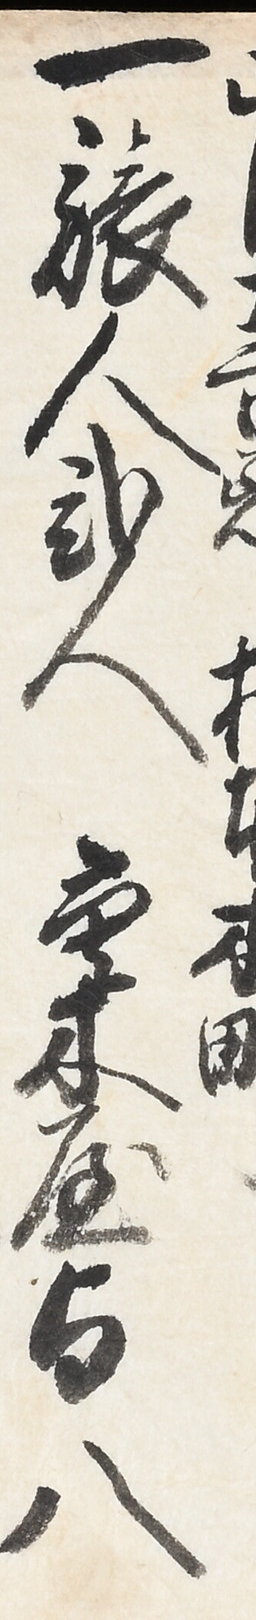一旅人弐人重木屋与八
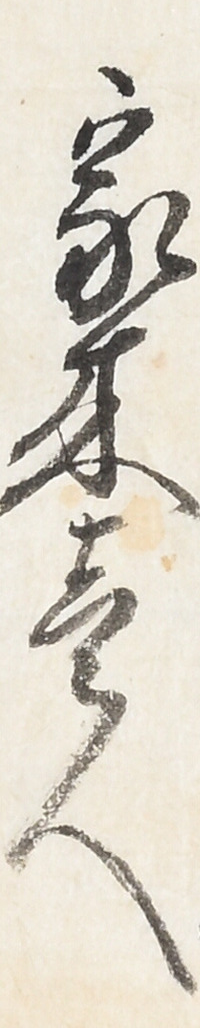家来壱人
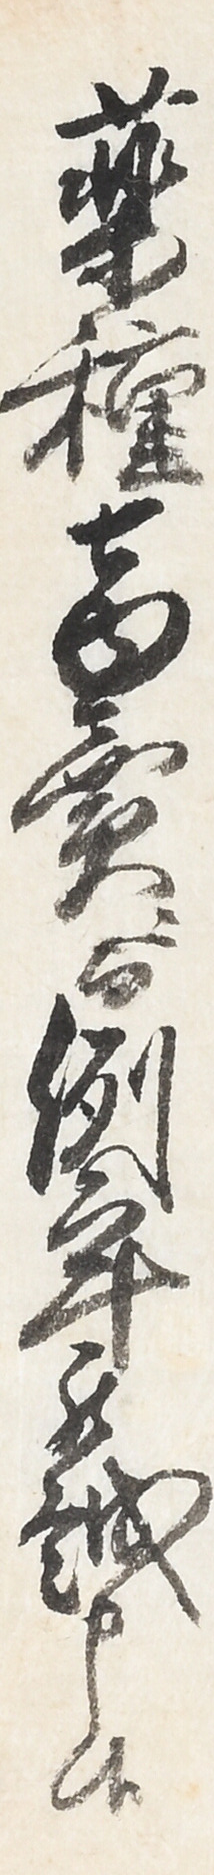薬種商売ニ而例年罷越申候
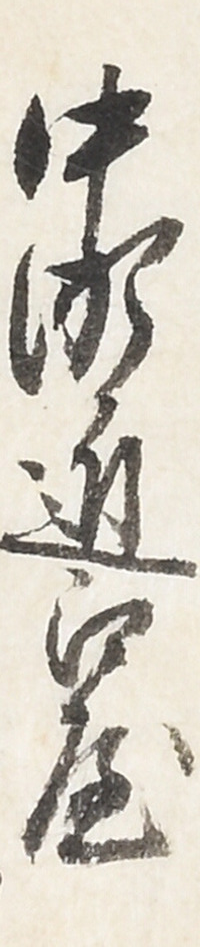中町近江屋
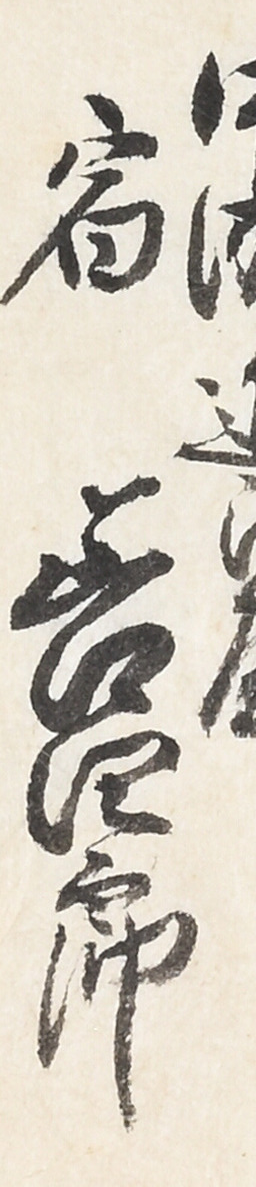宿善四郎
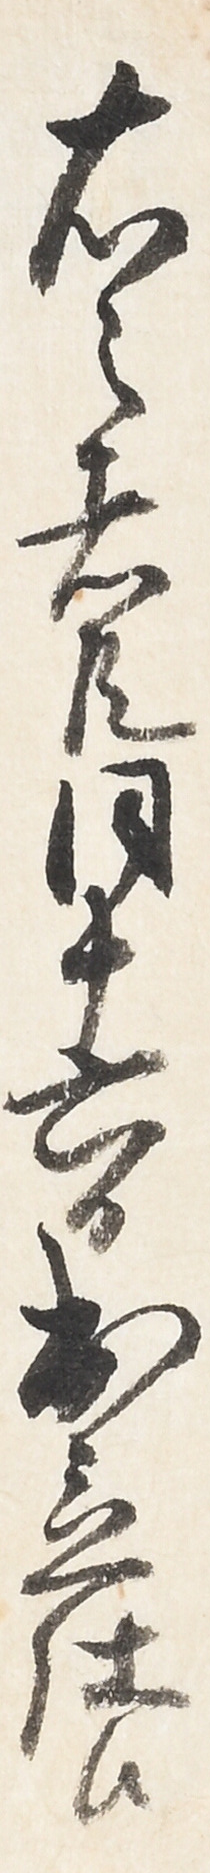右之者共同壱六日出立仕候
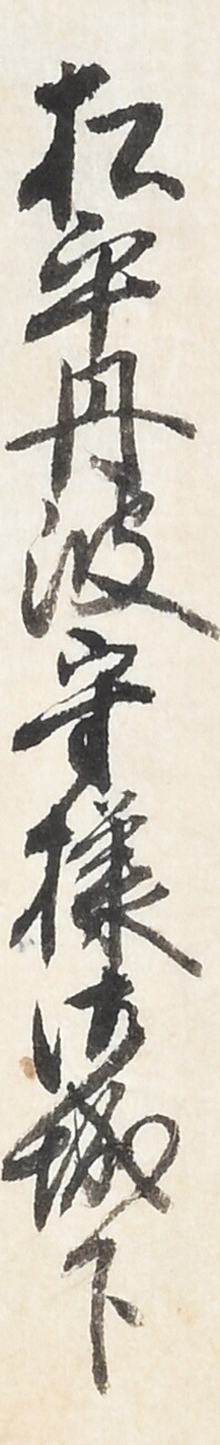松平丹波守様御城下
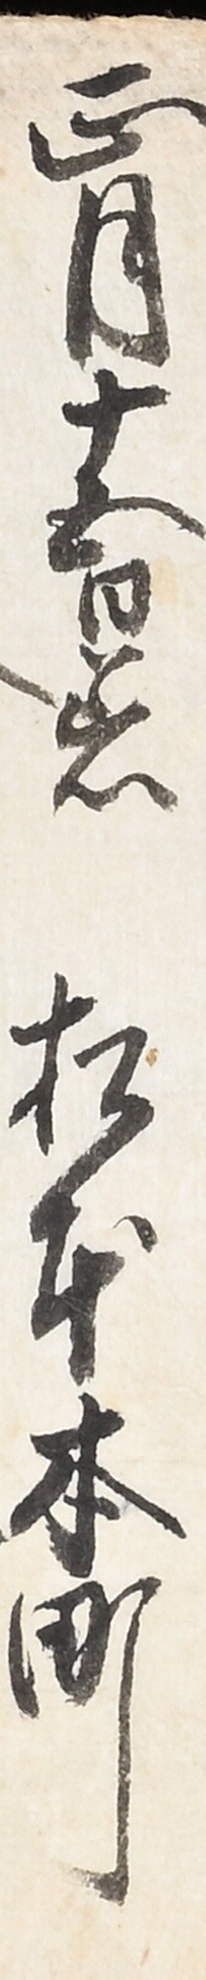正月十五日着松本本町
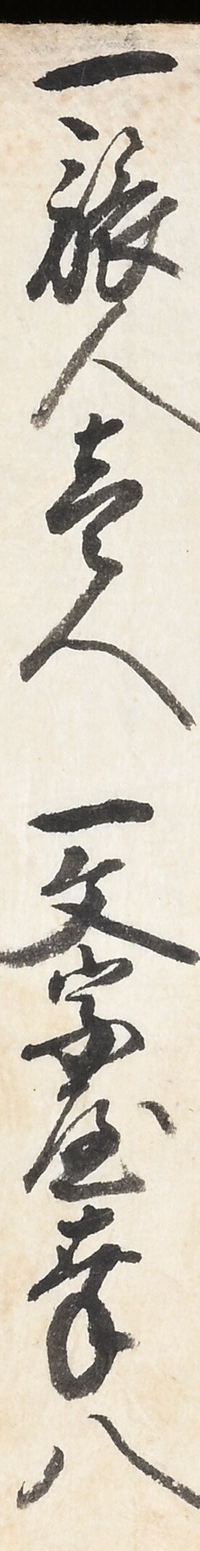一旅人壱人一文字屋幸八
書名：旅人泊控帳
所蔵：伊那市立高遠町図書館・合同会社AMANE
